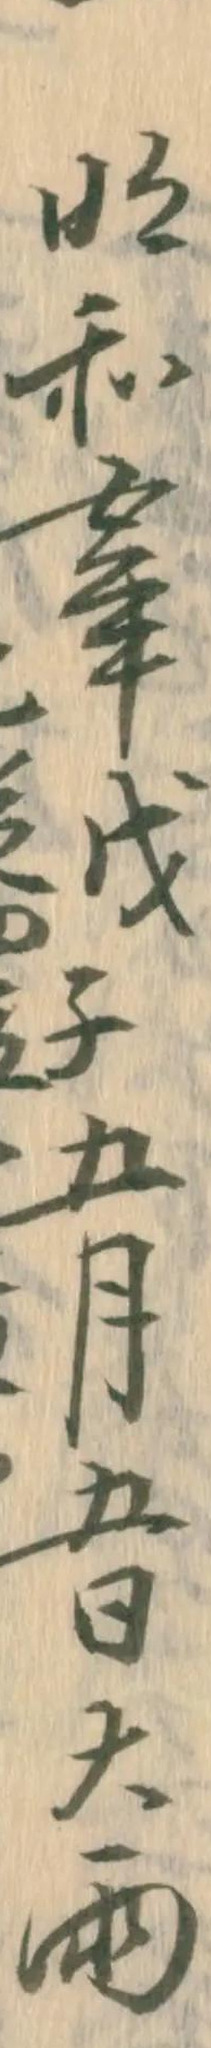一明和五年戊子五月五日大雨
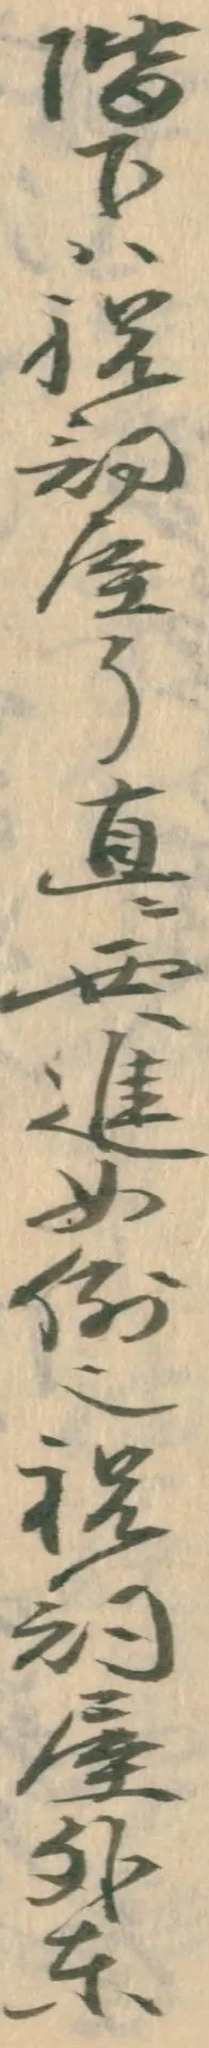階下ハ祝詞屋に直ニ西へ進如例也祝詞屋外東
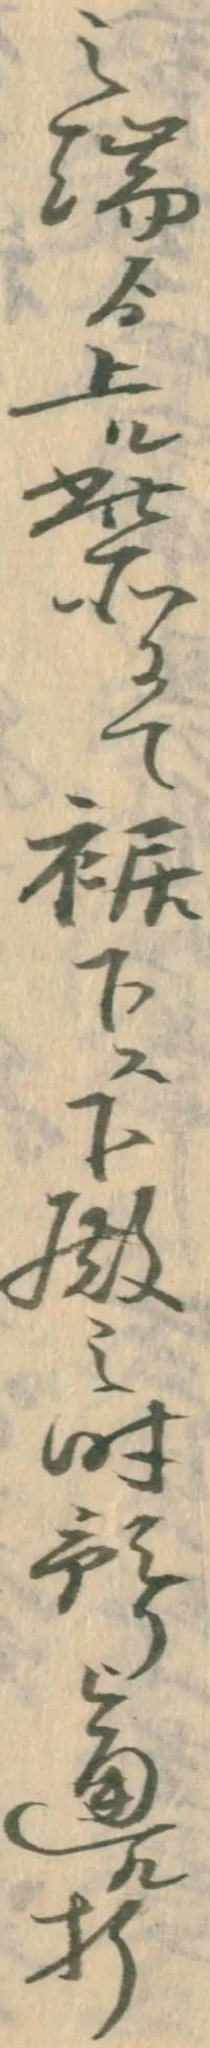之端ゟ上ル此所にて裾下ス下殿之時預り被通ル折
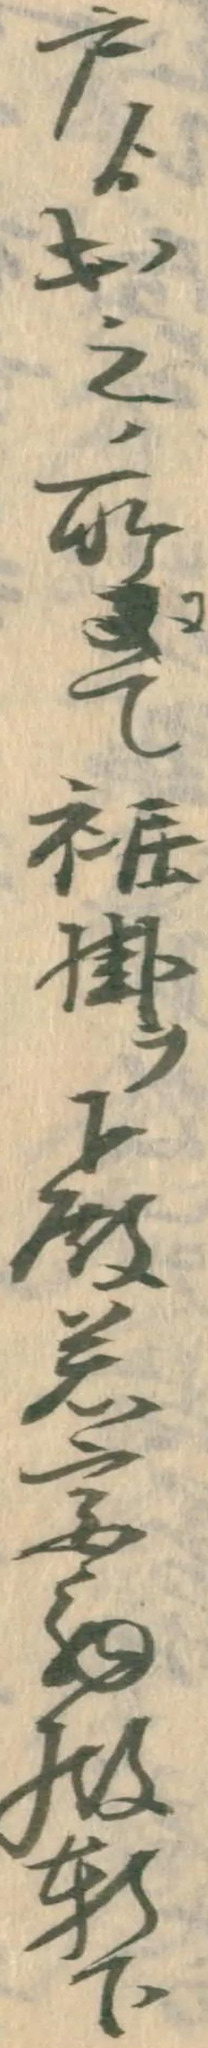戸ゟ出之ノ所にて裾掛ヲ下殿若宮西殿軒下
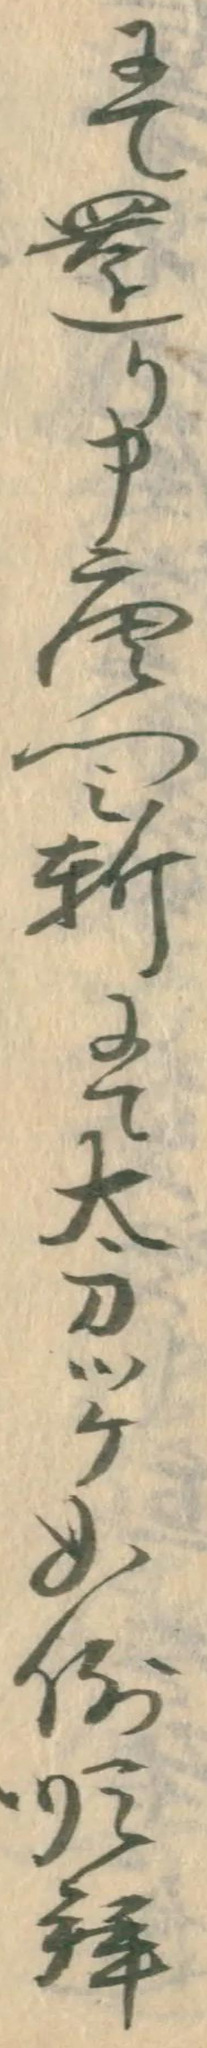にて還り申唐門之斬にて太刀ツケ如例順拝
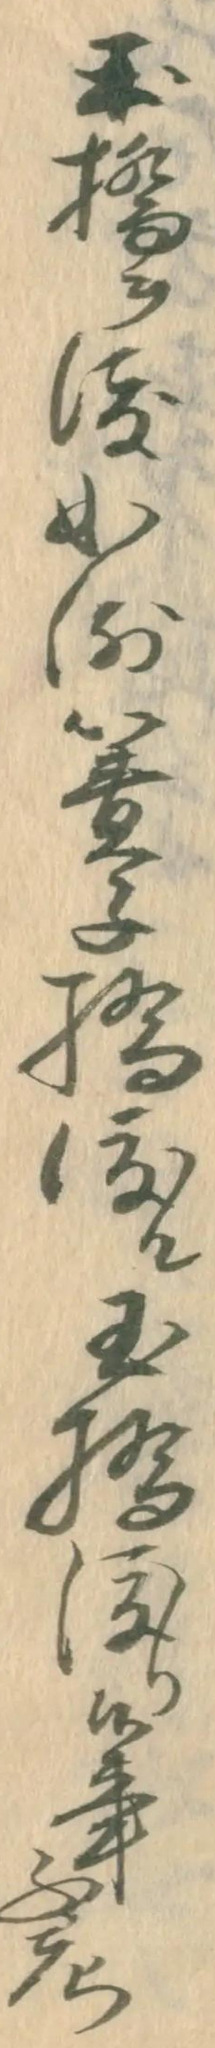玉橋ヲ渡如例簀子橋渡ル玉橋渡り候事不考

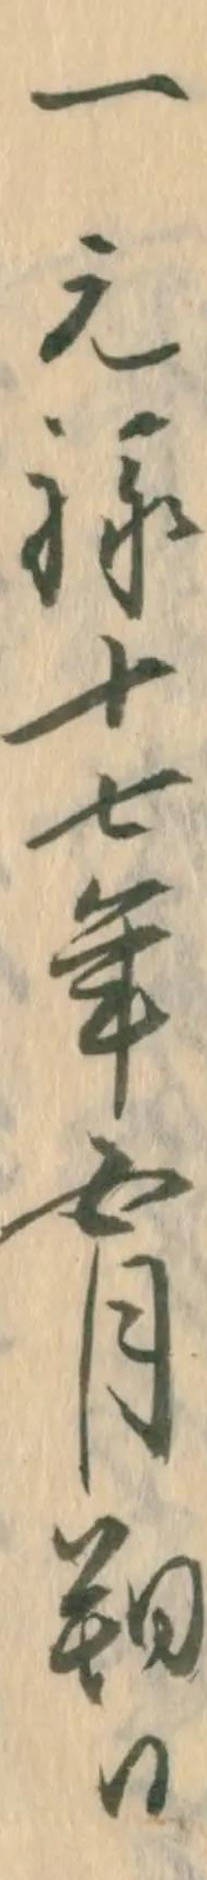一元禄十七年五月朔日
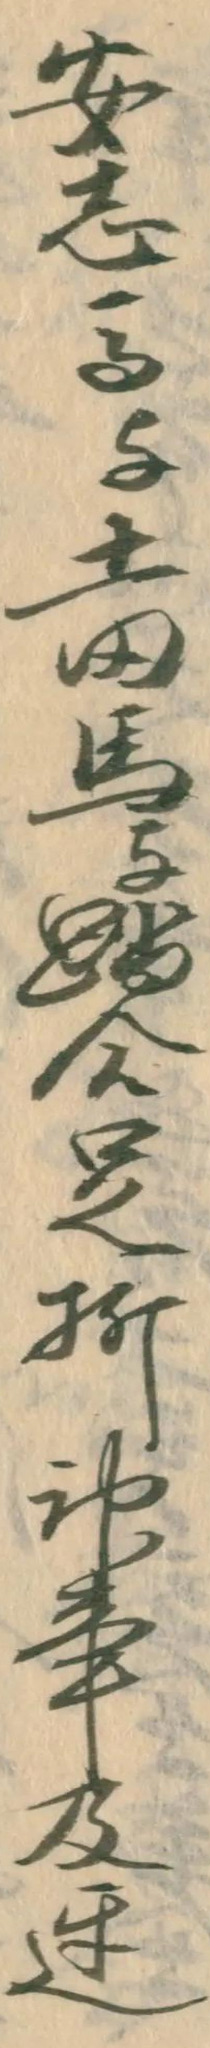安志馬と土田馬と踏合足折神事及遅
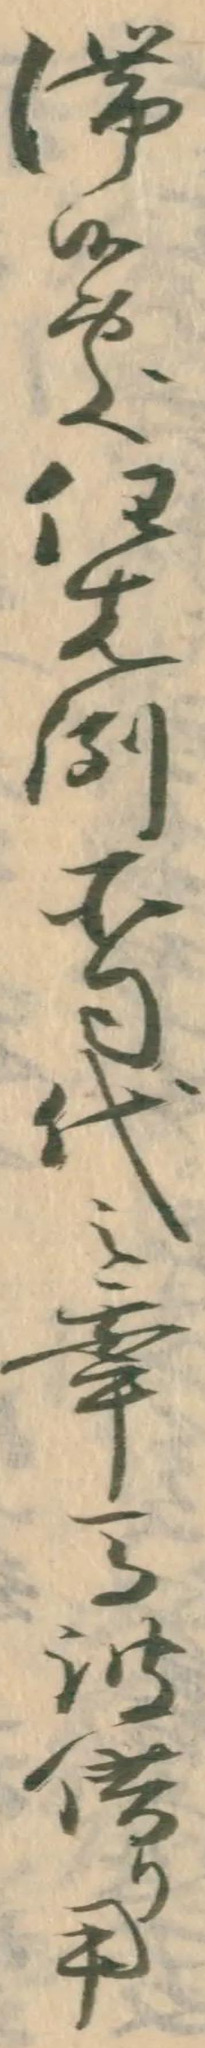滞候処任先例所司代之牽馬被借り用
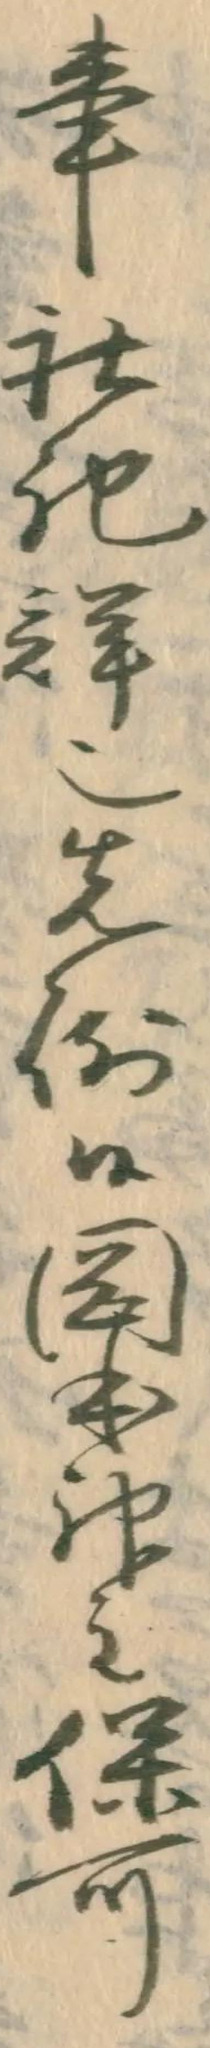事社記詳也先例候岡本神主保可
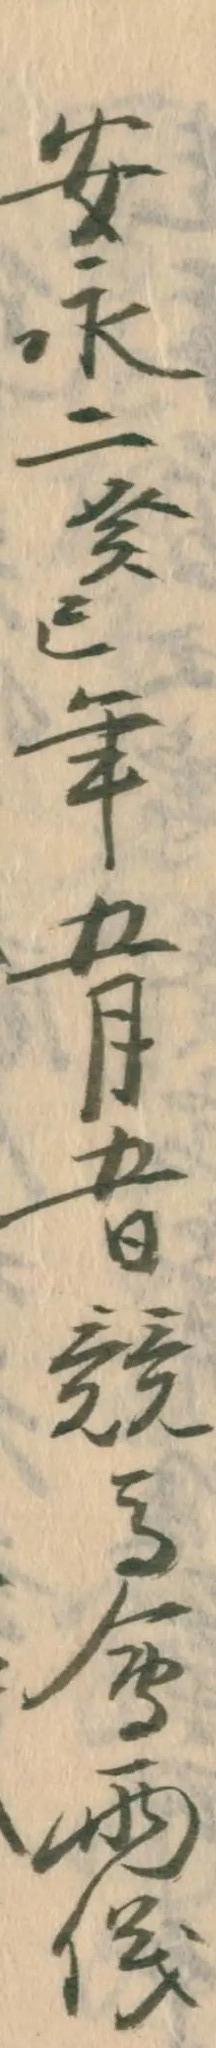一安永二癸巳年五月五日競馬会雨儀
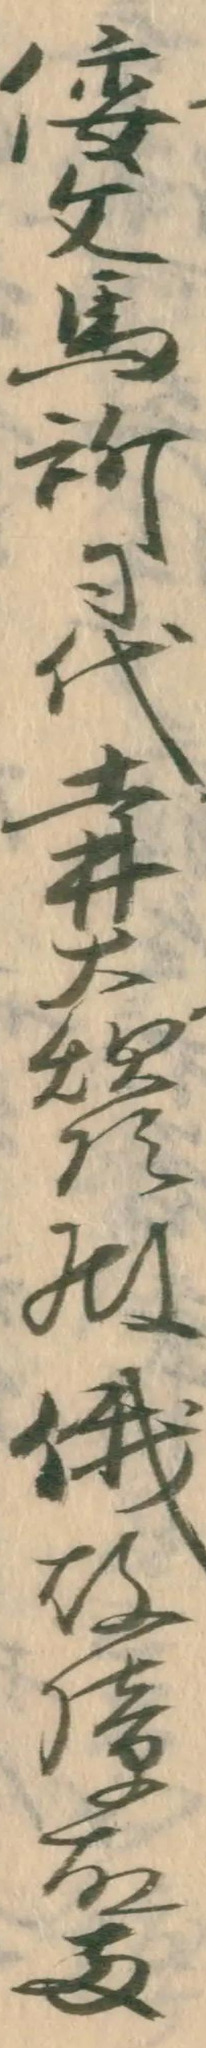倭文馬所司代土井大炊頭殿俄故障故両
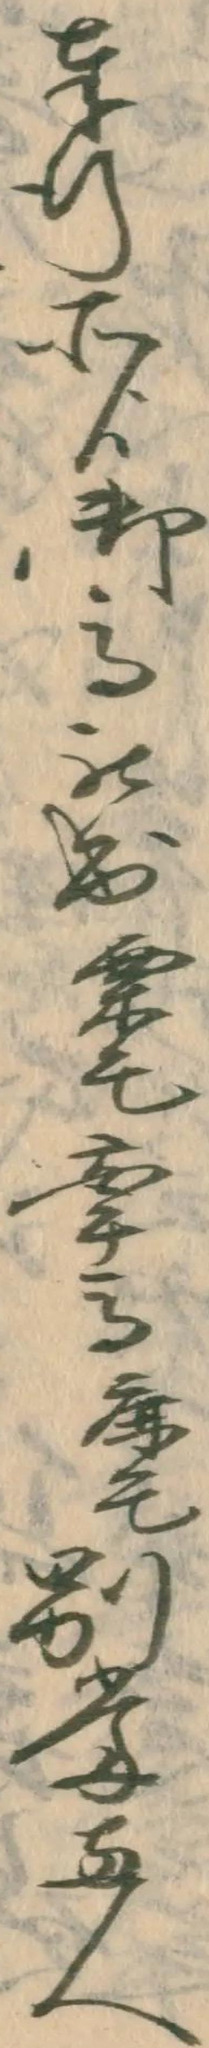奉行所ゟ御馬被出栗毛牽馬鹿毛別当両人
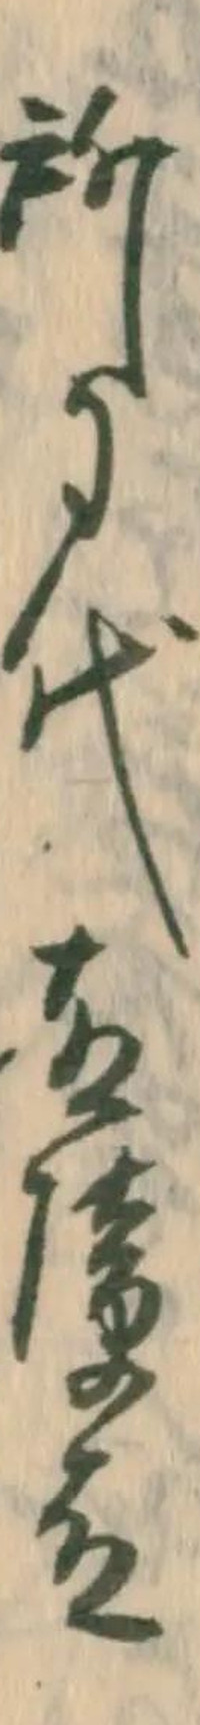所司代故障故
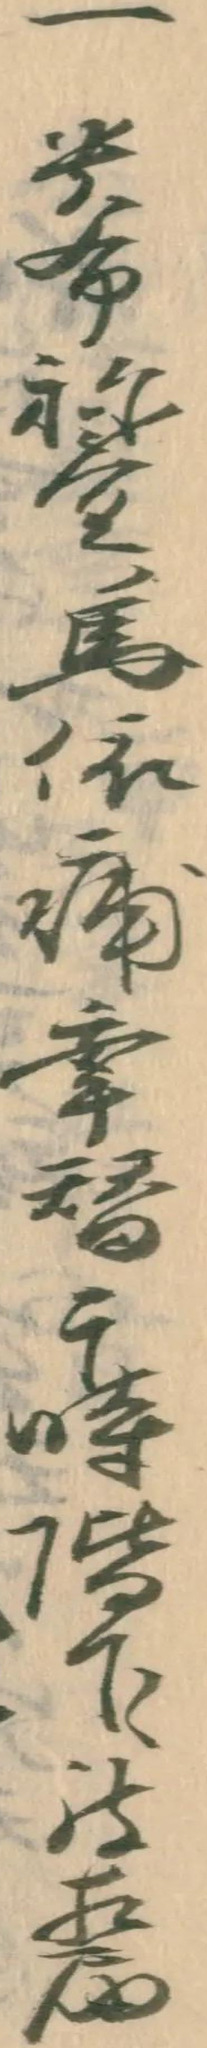一貴布祢宜ノ馬依痛牽替于時階下へ被相届
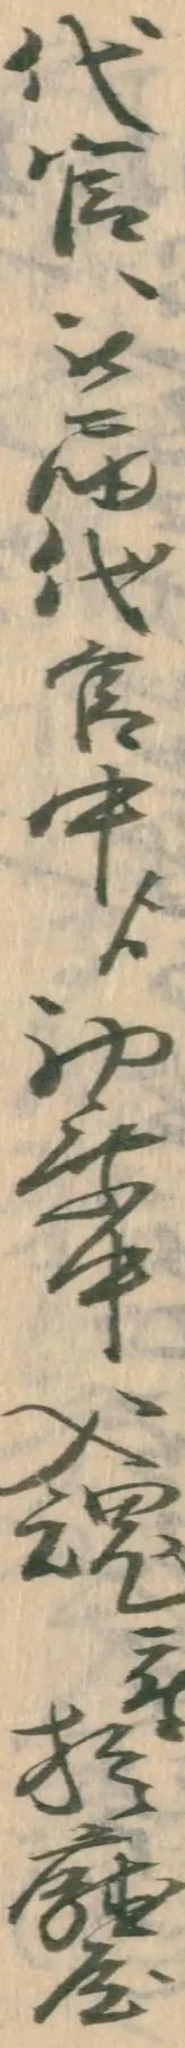代官へ被届代官中ゟ初乗中へ入魂ニ付於庁屋
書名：賀茂社記録. 第12冊
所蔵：国立国会図書館 National Diet Library, JAPAN
